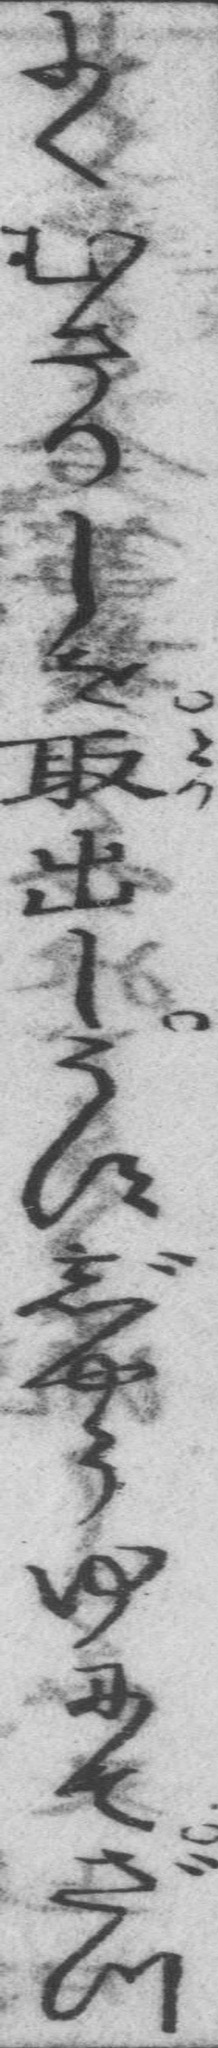よくむさりしを。取出し。うすじやうゆにて。ざつ
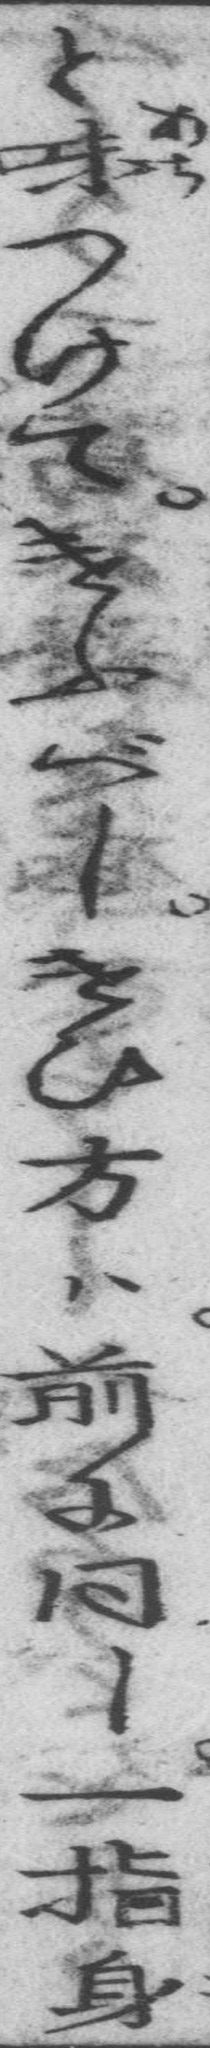と味つけて。遣ふべし。遣ひ方は。前に同し。一指身
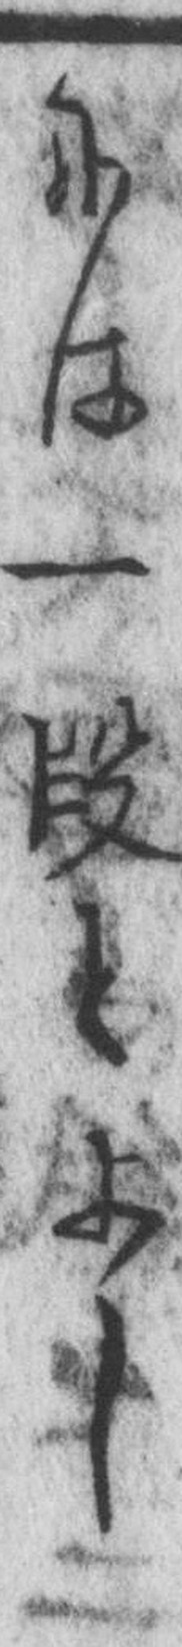には一段とよし
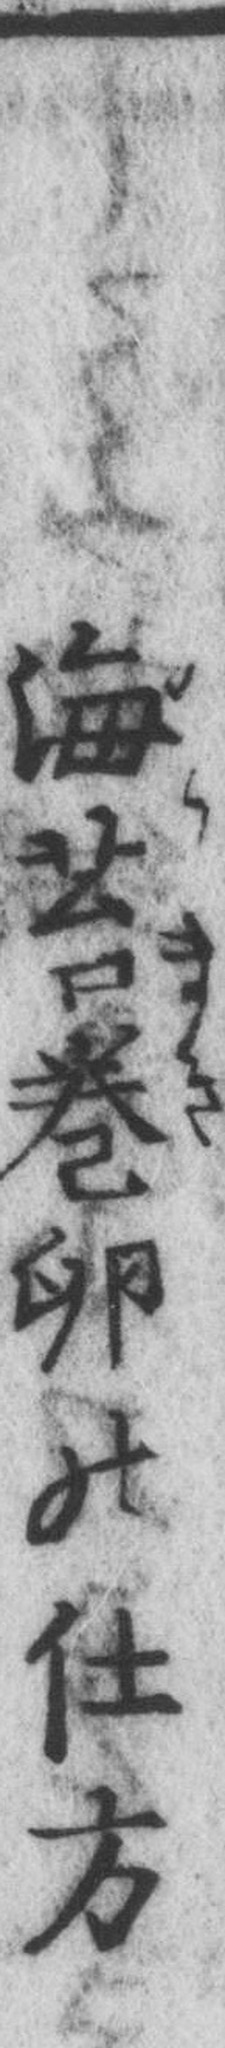海苔巻卵の仕方
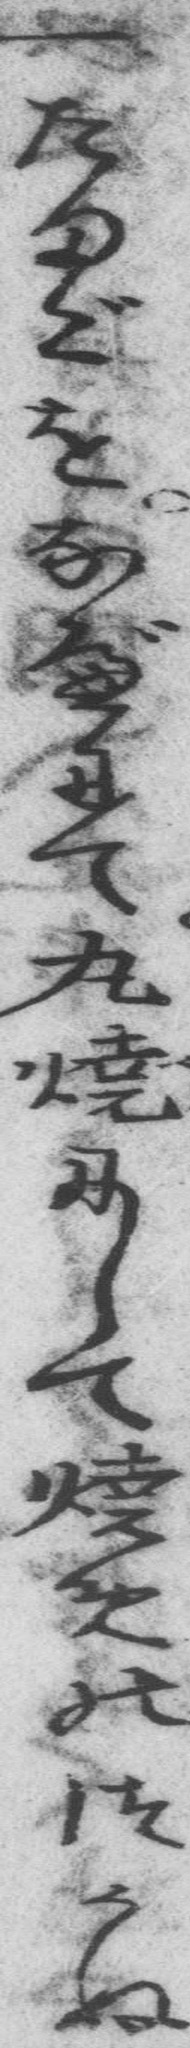一たまごを。なべにて。丸焼にして焼めのつかぬ
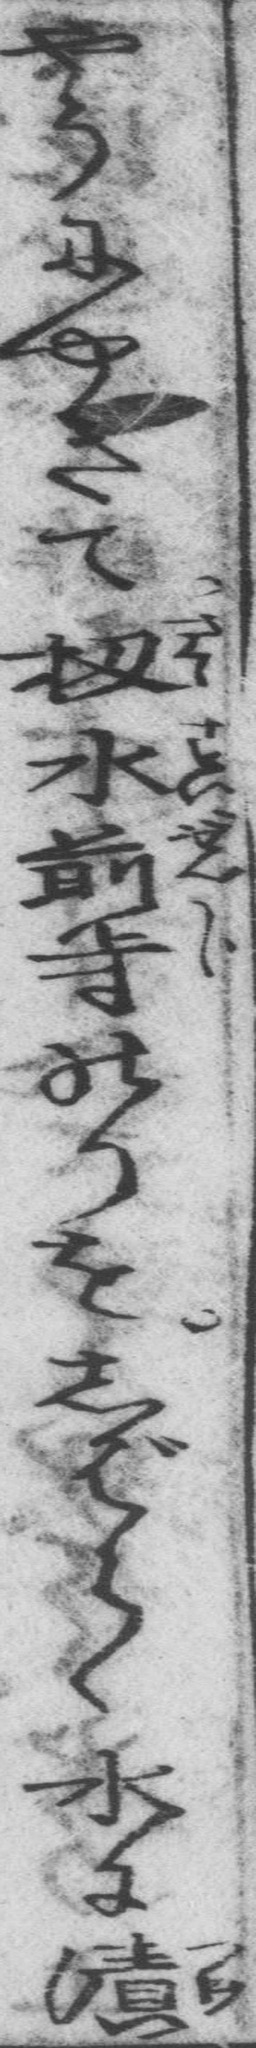やうにやきて。扨水前寺のりを。しばらく水に漬
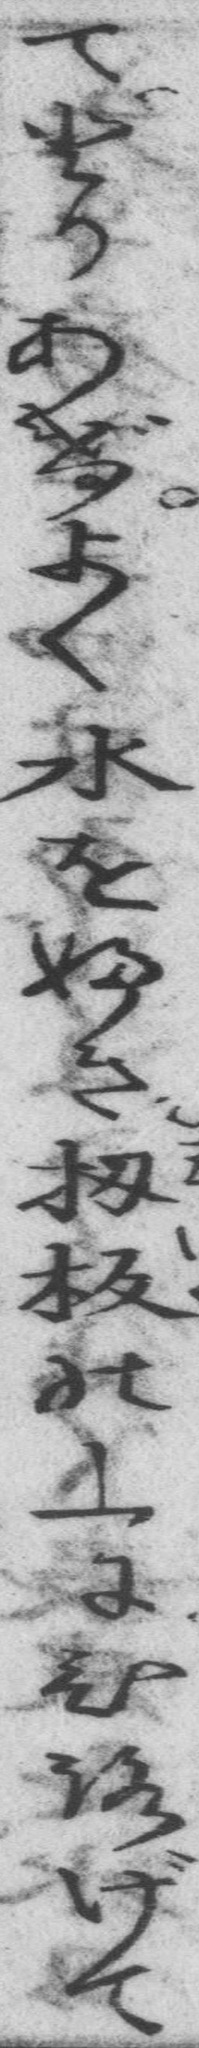て。とりあげ。よく水をふき。扨板の上に。ひろげて
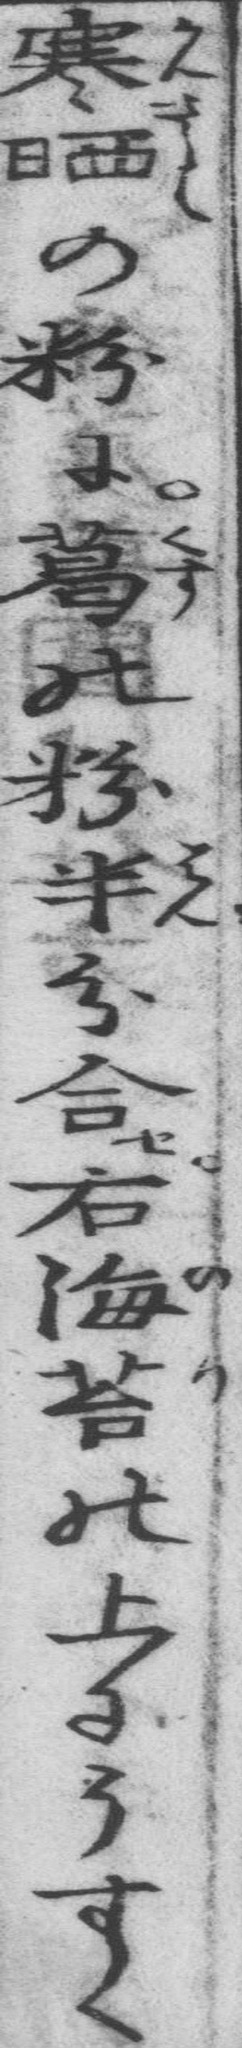寒晒の粉に。葛の粉半分合せ。右海苔の上にうすく
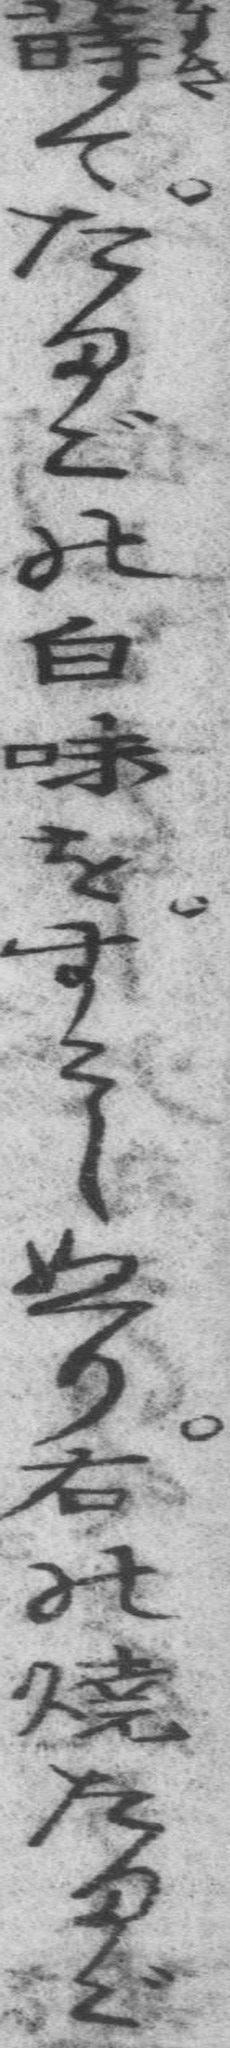蒔て。たまごの白味を。すこしぬり、右の焼たまご
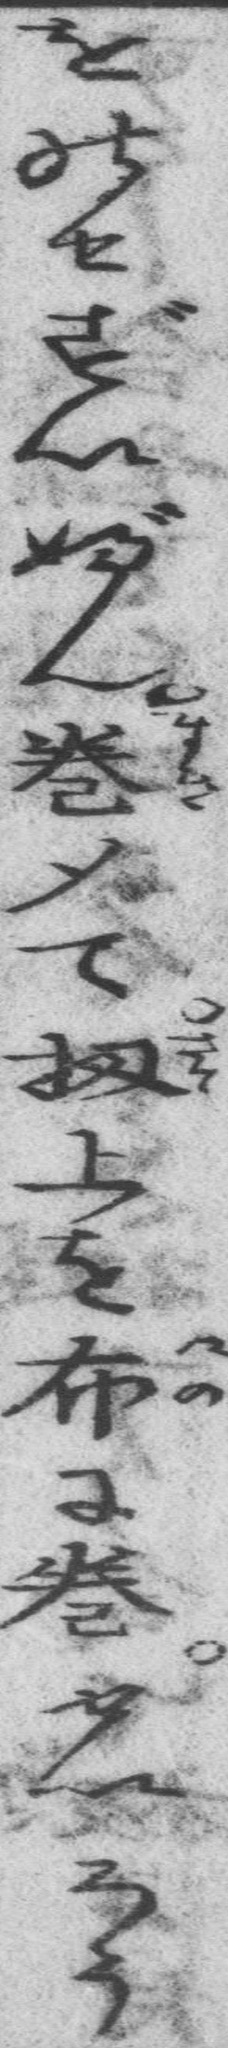をのせずいぶん。巻〆て。扨上を布に巻。せいろう
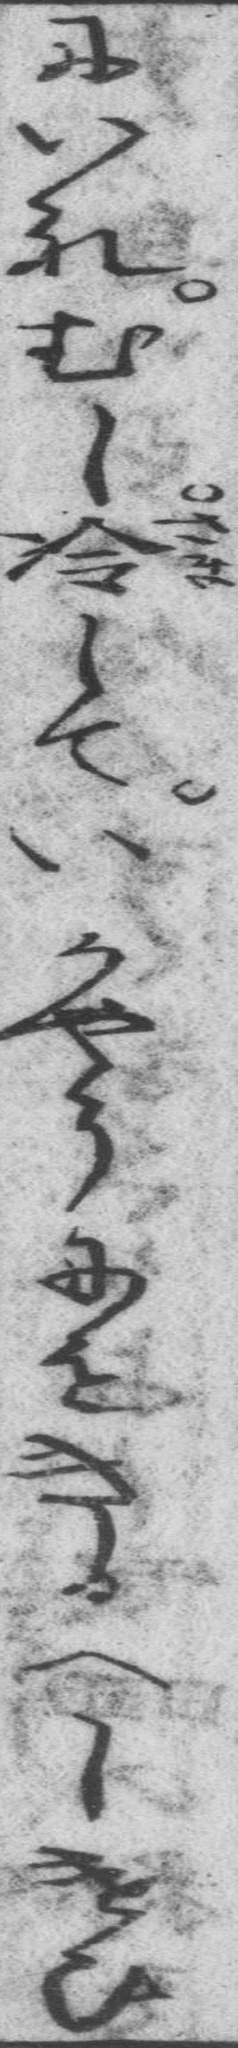にいれ。むし冷して。いかやうにもきるへし遣ひ
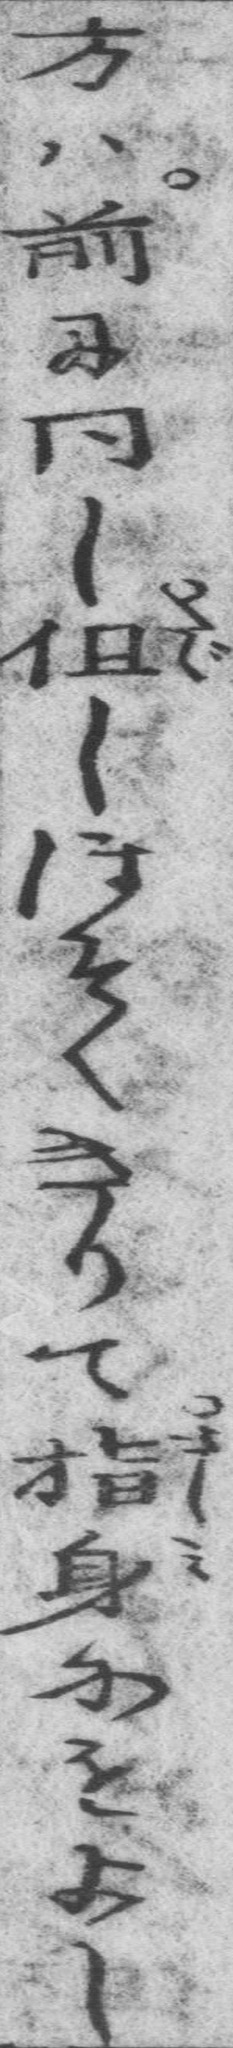方は。前に同し。但しほそくきりて。指身にもよし
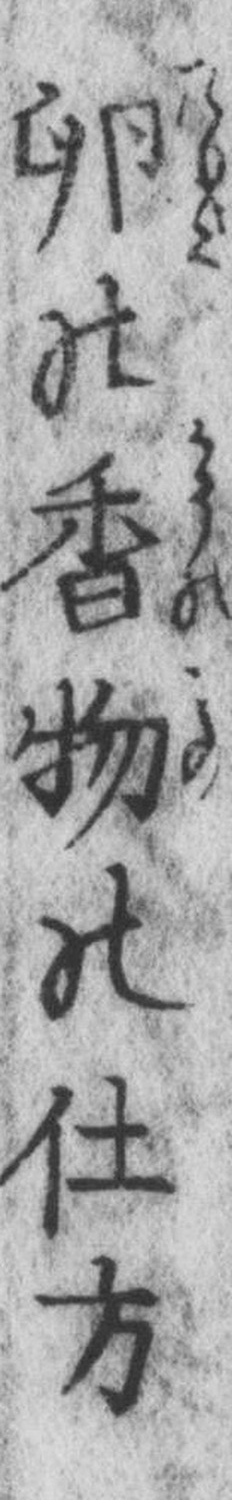卵の香物の仕方
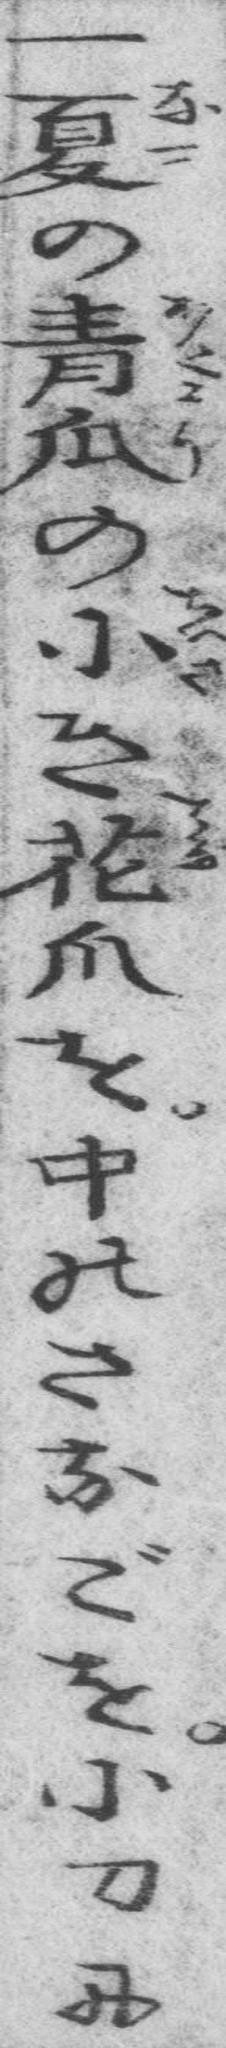一夏の青瓜の小き花瓜を。中のさなごを。小刀に
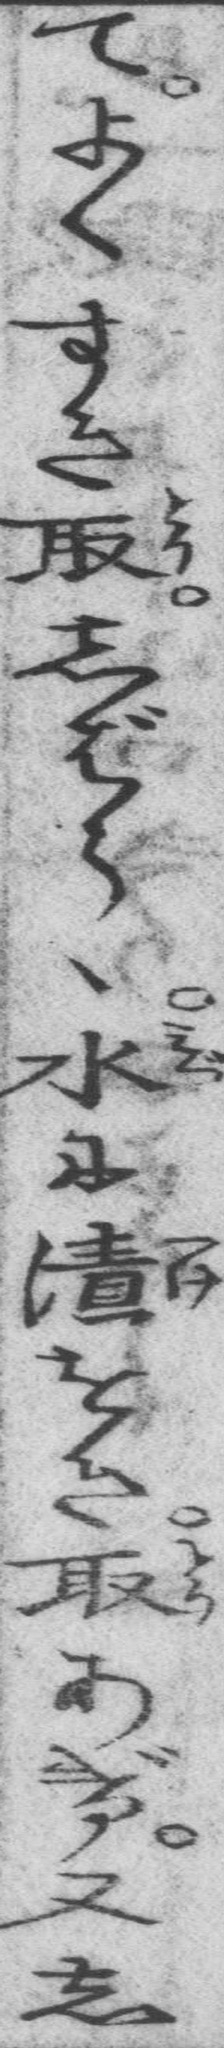て。よくすき取。しばらく。水に漬をき。取あげ。又し
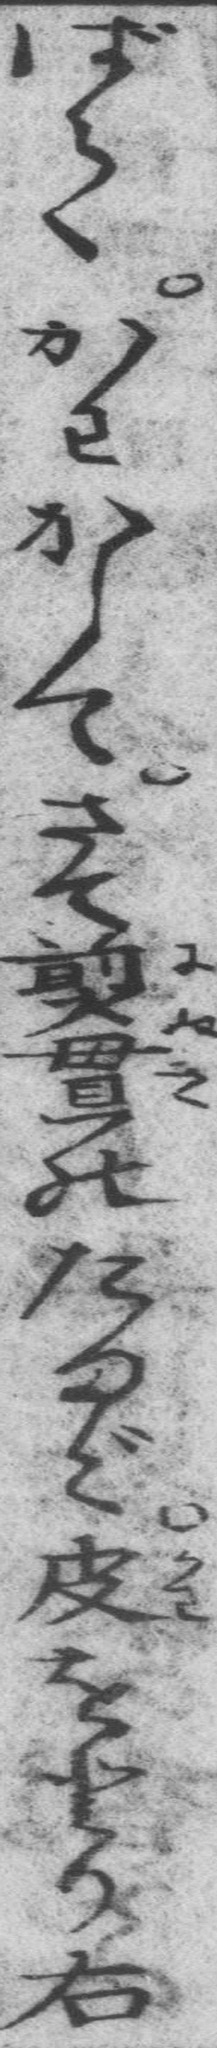ばらく。かわかして。さて煎貫のたまご。皮をとり右
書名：萬寳料理秘密箱
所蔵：大阪府立大学学術情報センター 国文学研究資料館
